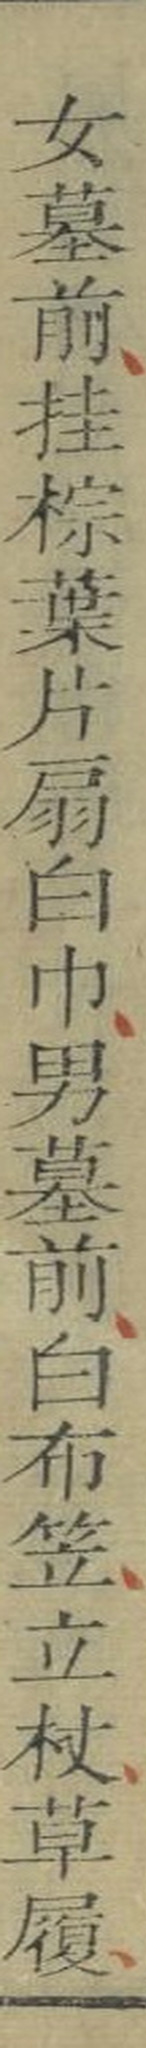女墓前挂棕葉片扇白巾男墓前白布笠立杖草履
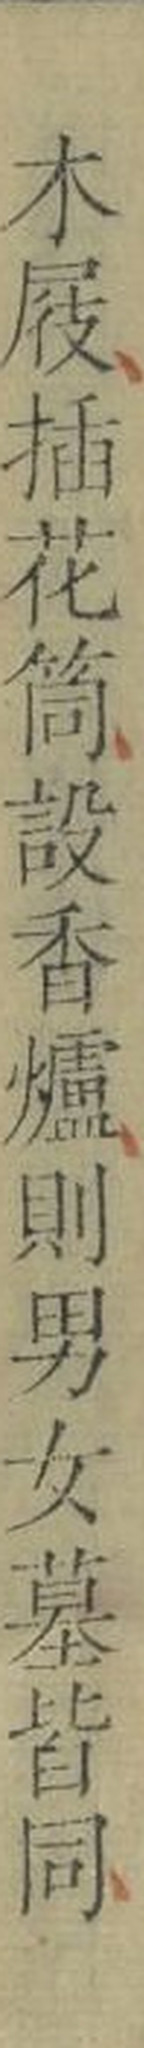木屐揷花筒設香炉則男女墓皆同
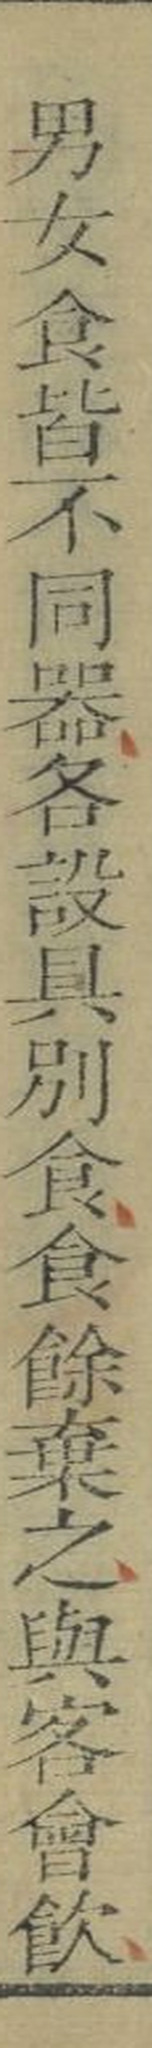男女食皆不同器各設具別食食余棄之与客会飲
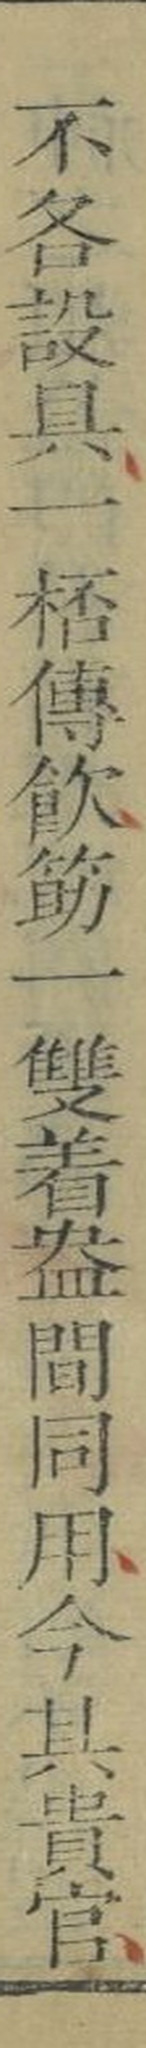不各設具一杯伝飲筯一双着盎間同用今其貴官
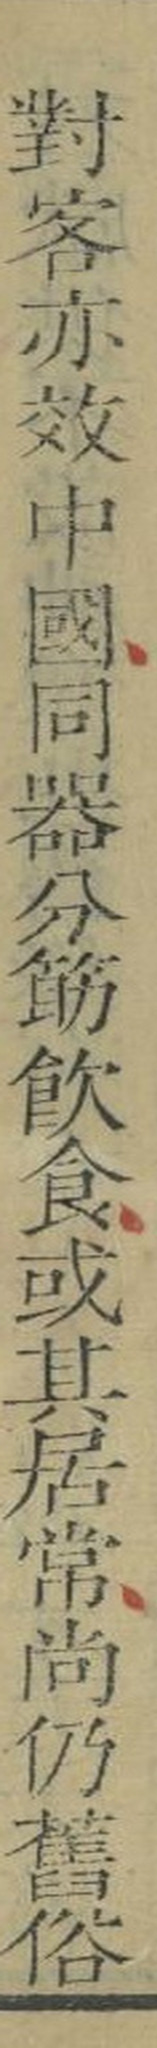対客亦效中国同器分筯飲食或其居常尚仍旧俗
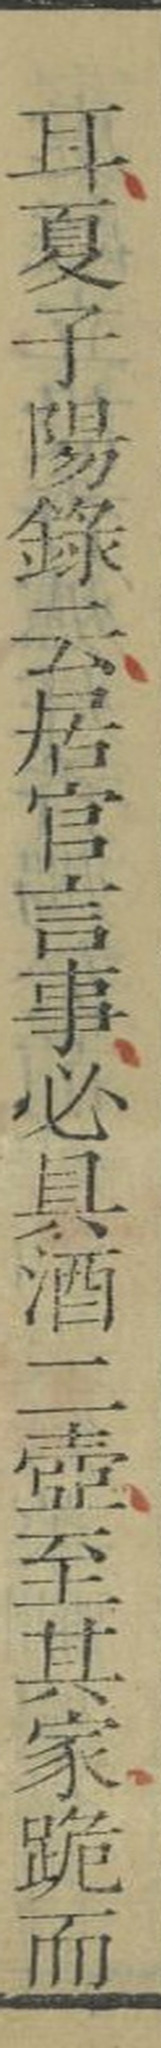耳夏子陽録云居官言事必具酒二壺至其家跪而
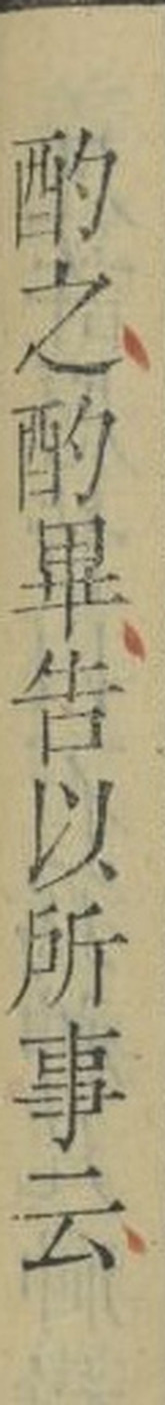酌之酌畢告以所事云
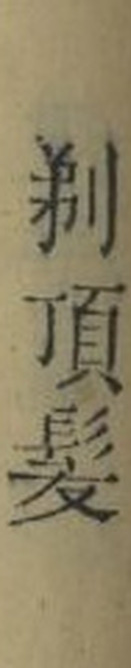剃頂髪
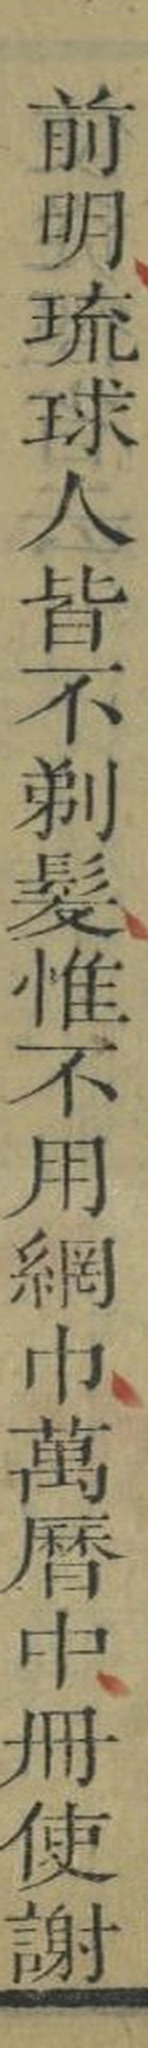前明琉球人皆不剃髪惟不用網巾万暦中冊使謝
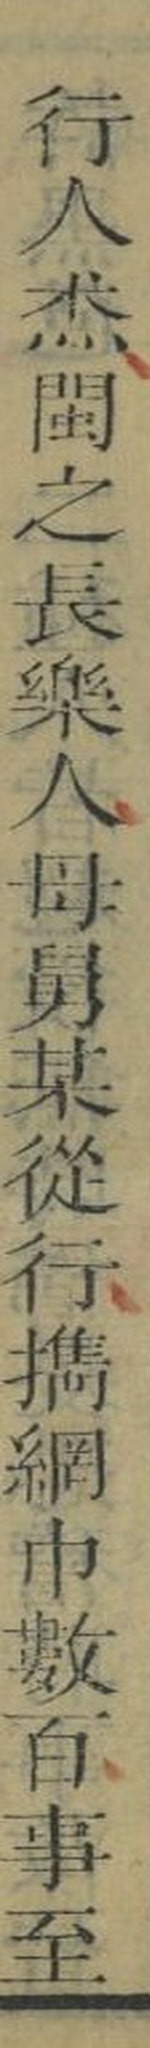行人杰閩之長楽人母舅某従行携網巾数百事至
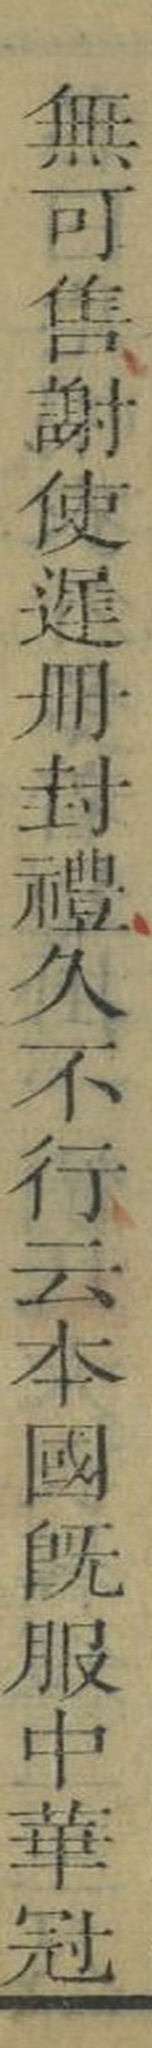無可售謝使遅冊封礼久不行云本国既服中華冠
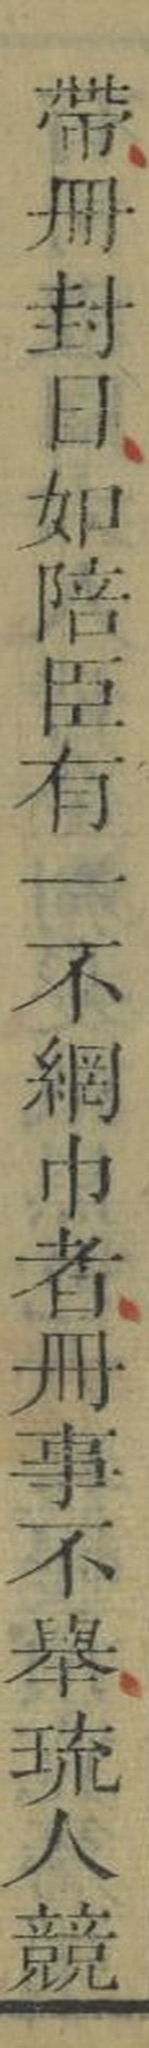帯冊封曰如陪臣有一不網巾者冊事不挙琉人競
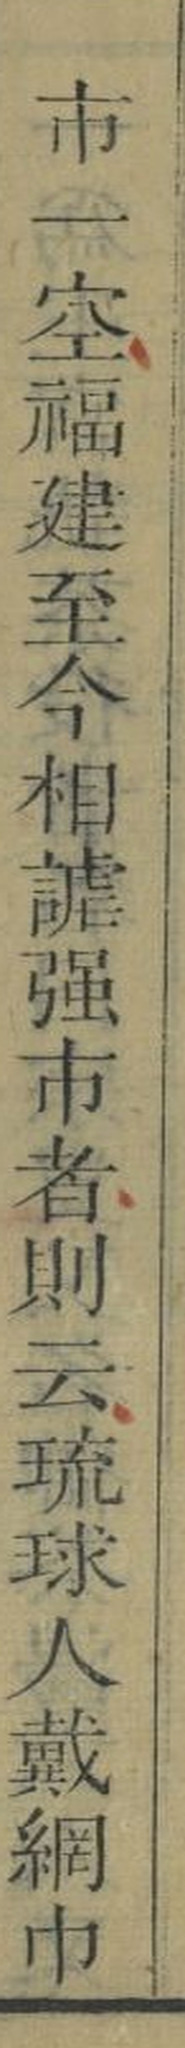市一空福建至今相謔強市者則云琉球人戴網巾
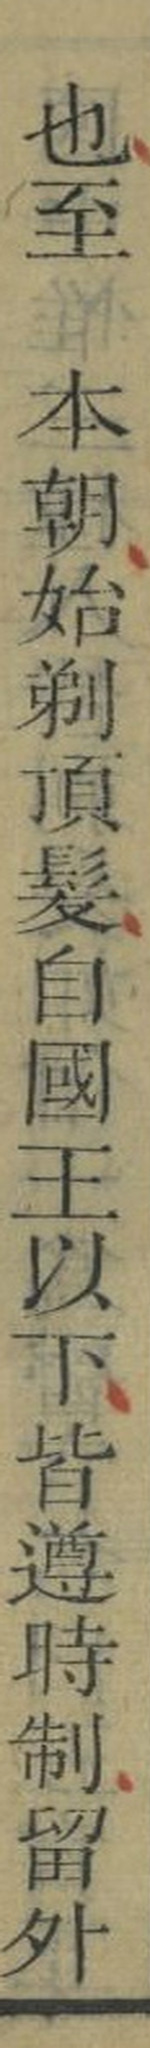也至本朝始剃頂髪自国王以下皆遵時制留外
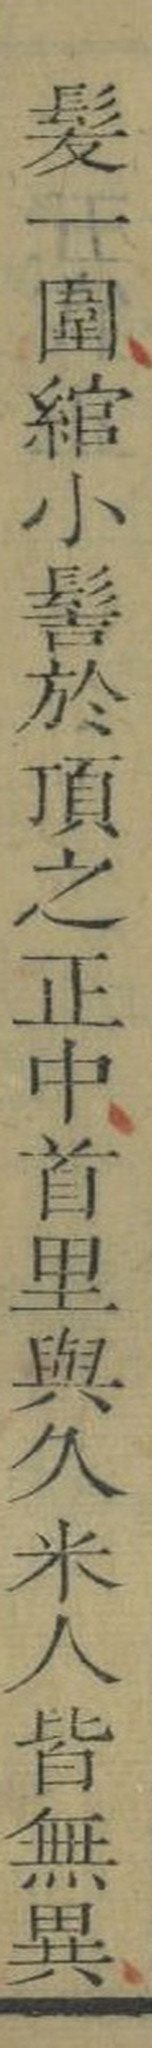髪一囲綰小髻於頂之正中首里与久米人皆無異
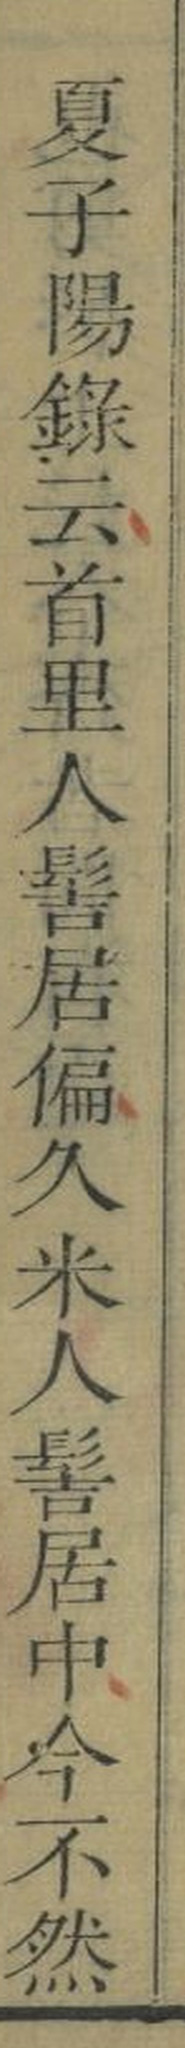夏子陽録云首里人髻居偏久米人髻居中今不然
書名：中山伝信録 巻六
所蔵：University of the Ryukyus Library
